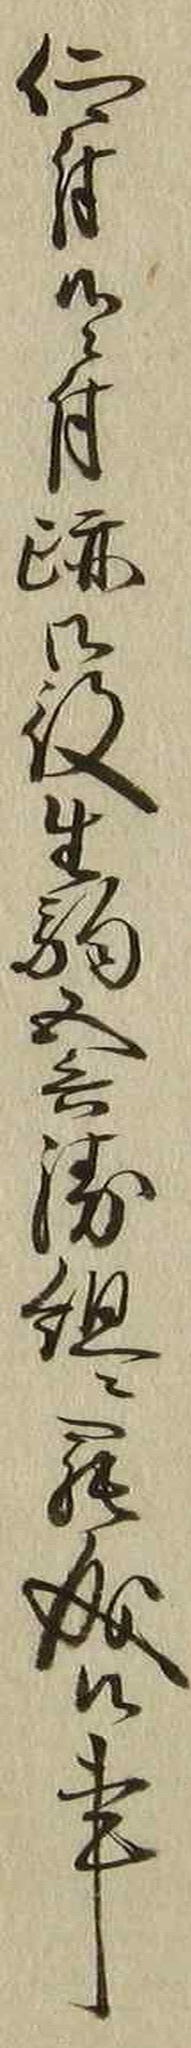仰付候ニ付跡御役生駒五兵衛組ニ罷成候事
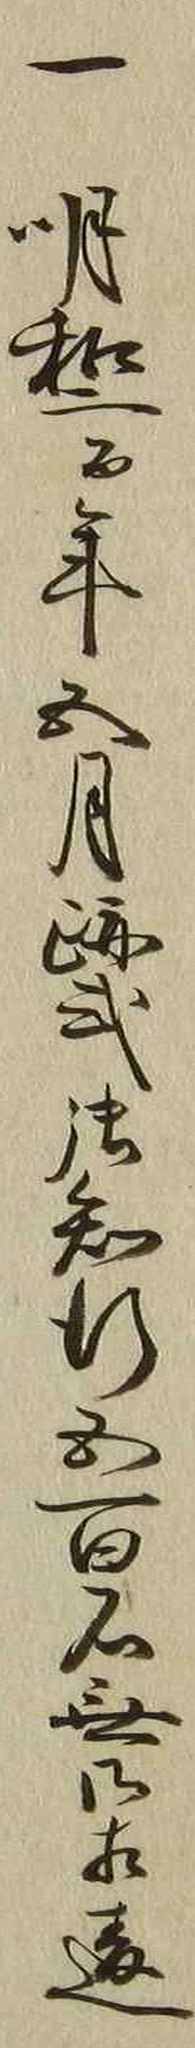一明和二酉年五月跡式知行五百石無御相違
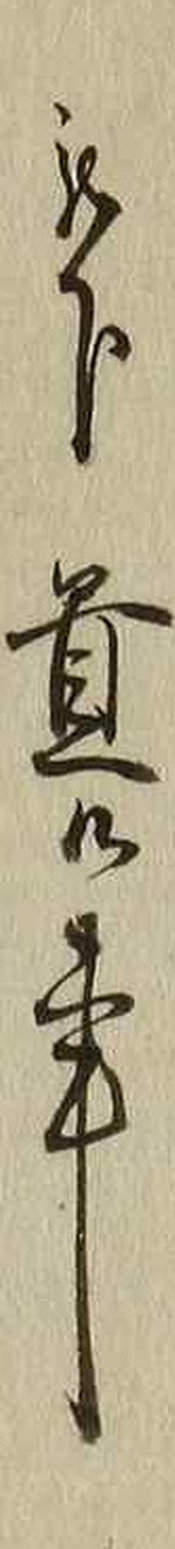被下置候事
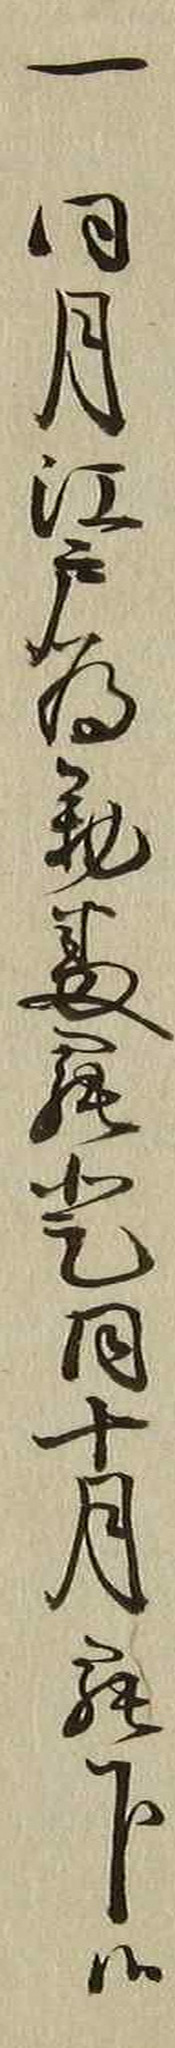一同月江戸為勤番罷登十月罷下候
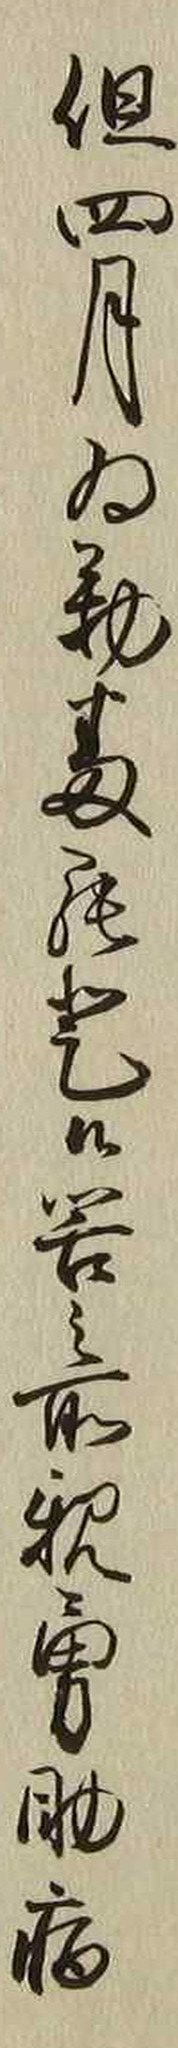但四月為勤番罷登候筈之所親勇助病
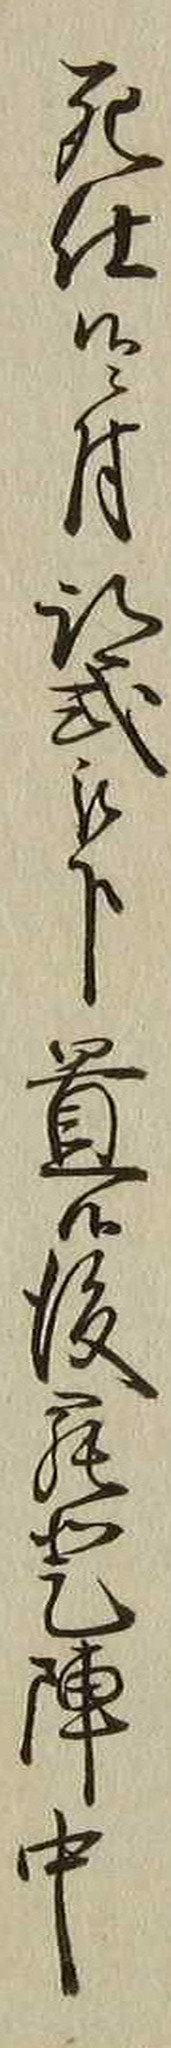死仕候ニ付跡式被下置候後罷登陣中
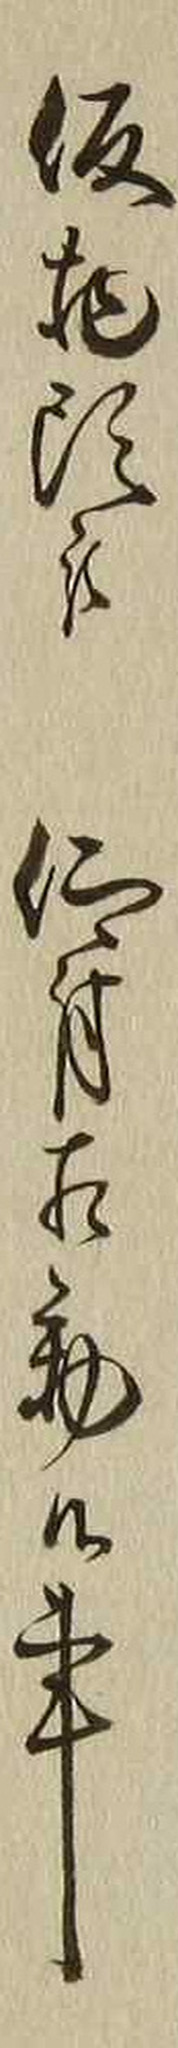仮物頭被仰付相勤候事
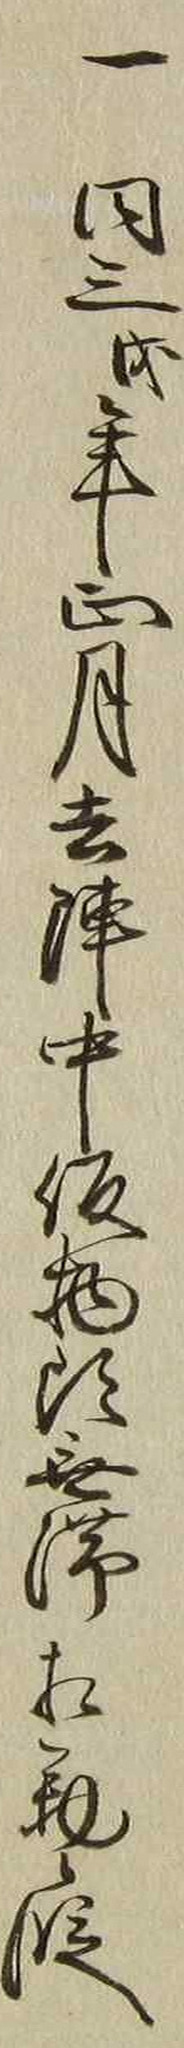一同三戌年正月去陣中仮物頭無滞相勤候段
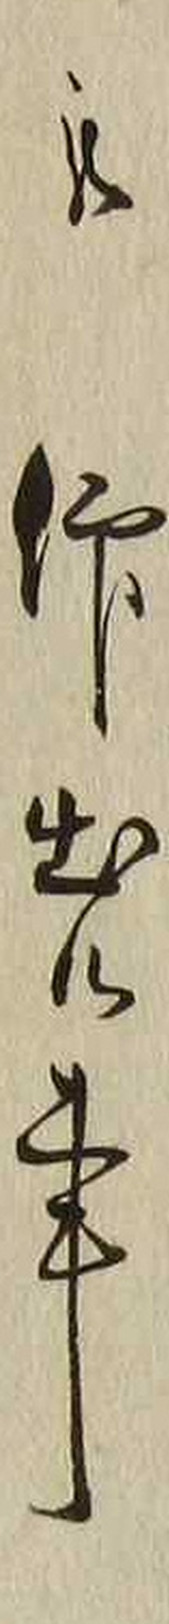被仰出候事
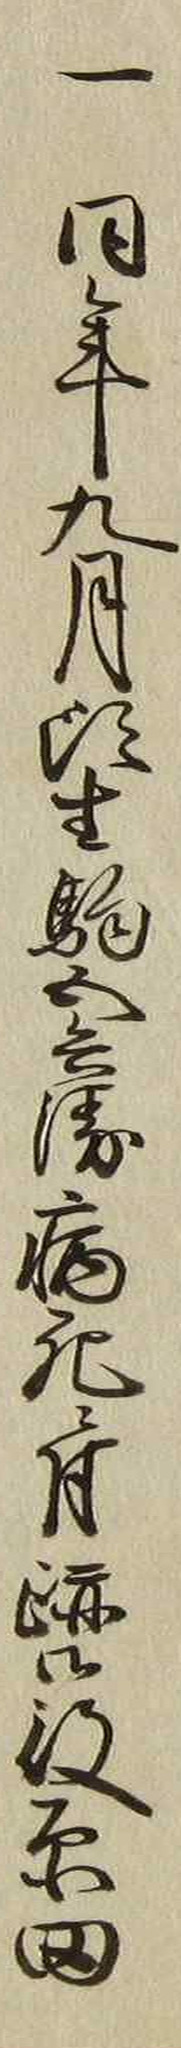一同年九月頭生駒五兵衛病死ニ付跡御役原田
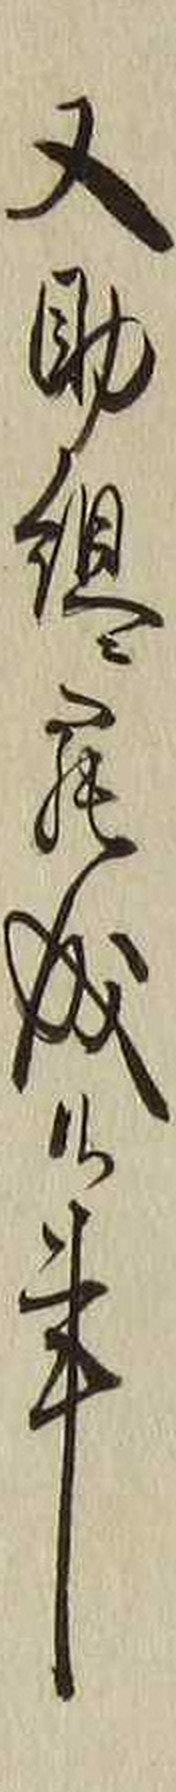又助組ニ罷成候事
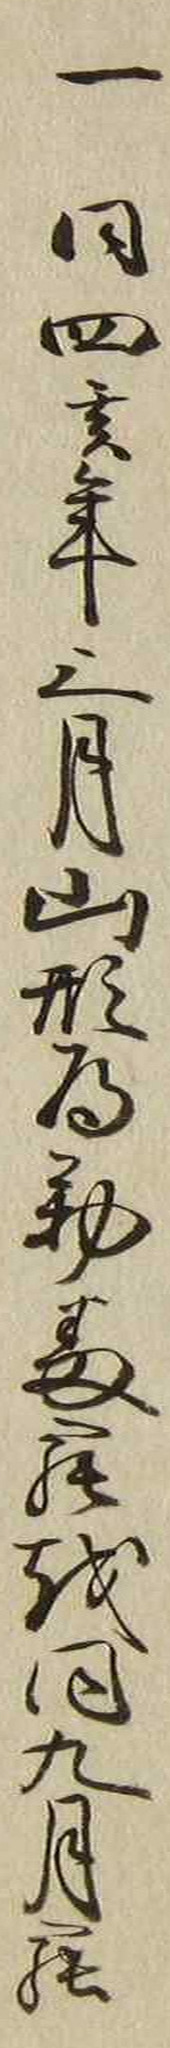一同四亥年三月山形為勤番罷越同九月罷
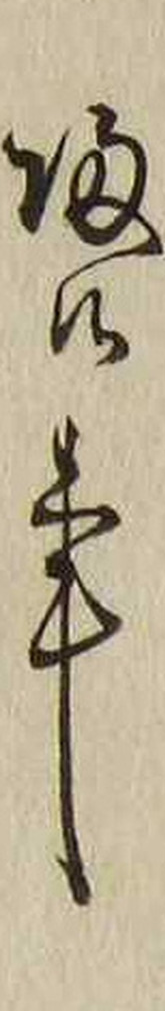帰候事
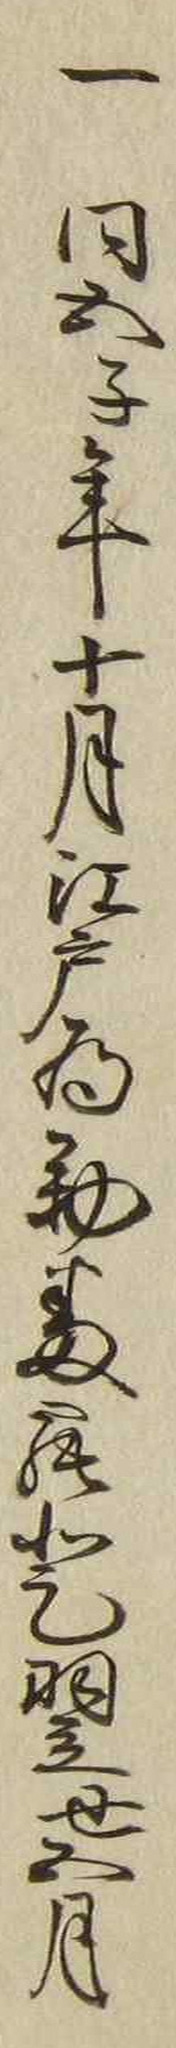一同五子年十月江戸為勤番罷登翌丑五月

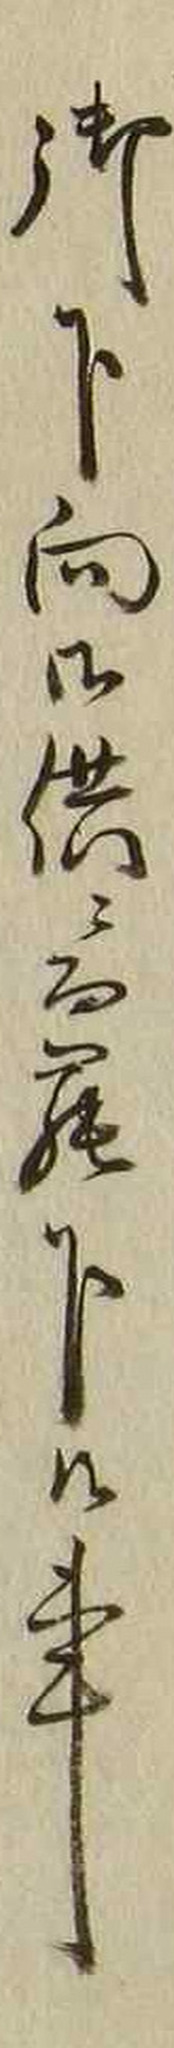御下向御供ニ而罷下候事
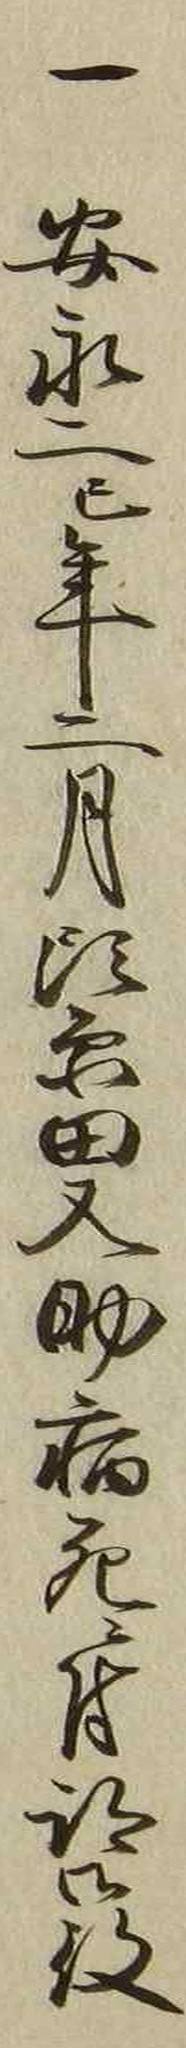一安永二巳年二月頭原田又助病死ニ付跡御役
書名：諸士系譜　巻之65　ち之部1
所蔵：会津若松市立会津図書館
